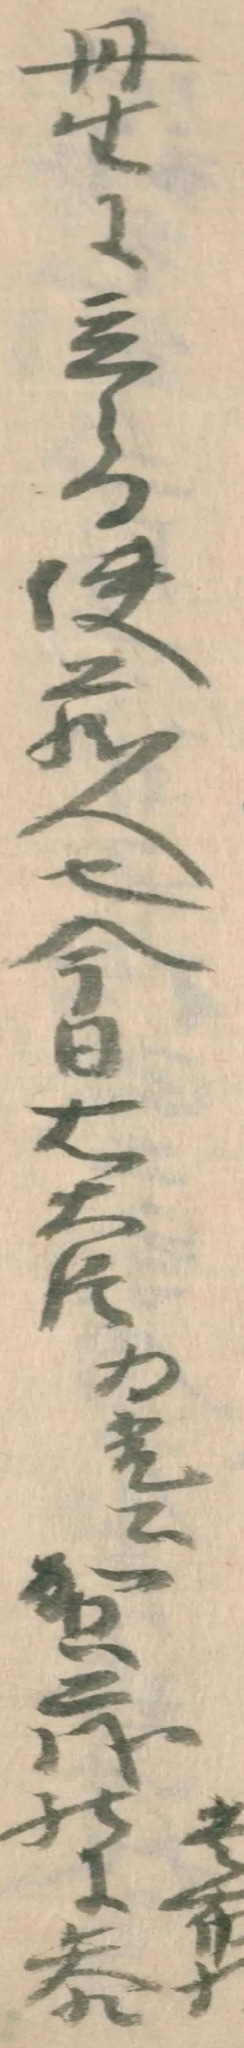丹生に立らる使蔵人也今日右大臣為光公賀茂社に参
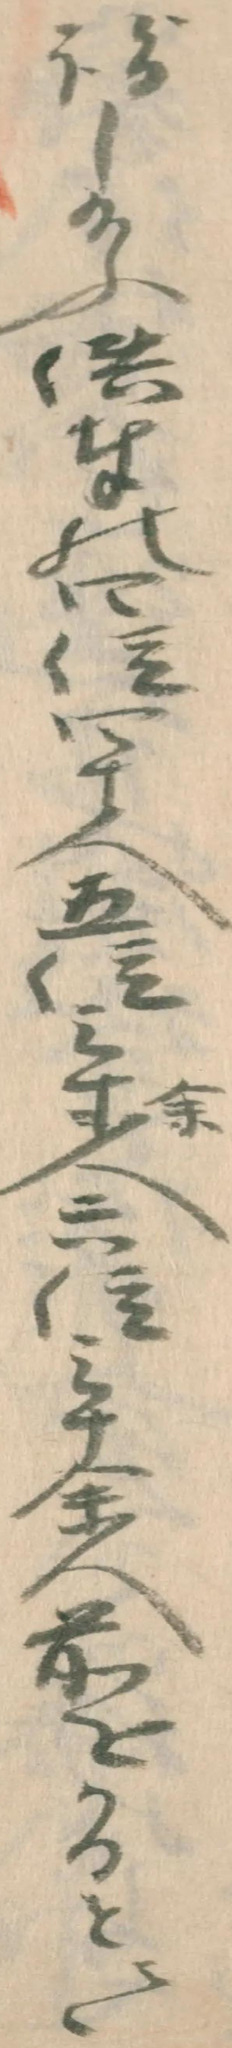詣し給ふ供奉の四位四十人五位三十◦人六位三十余人前をかると云々
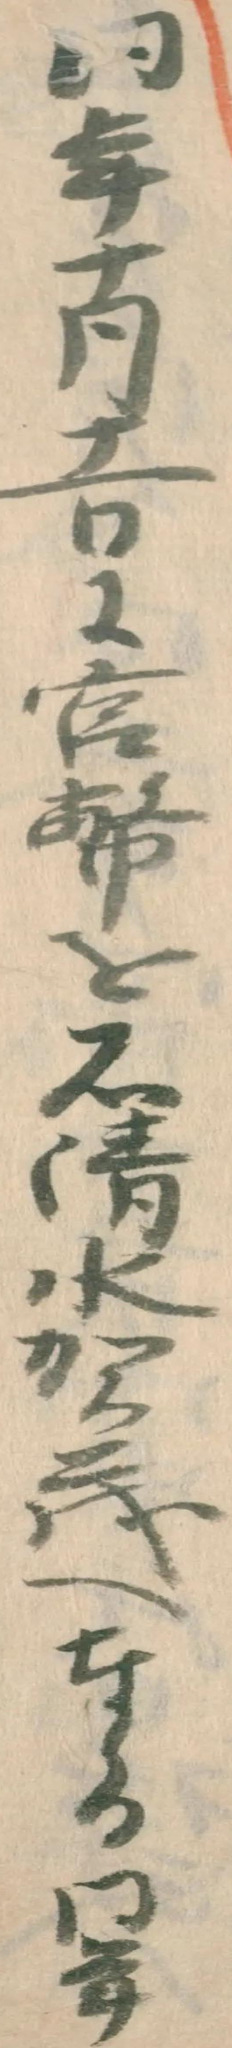同年十月十一日に宮幣を石清水賀茂へ奉らる同年
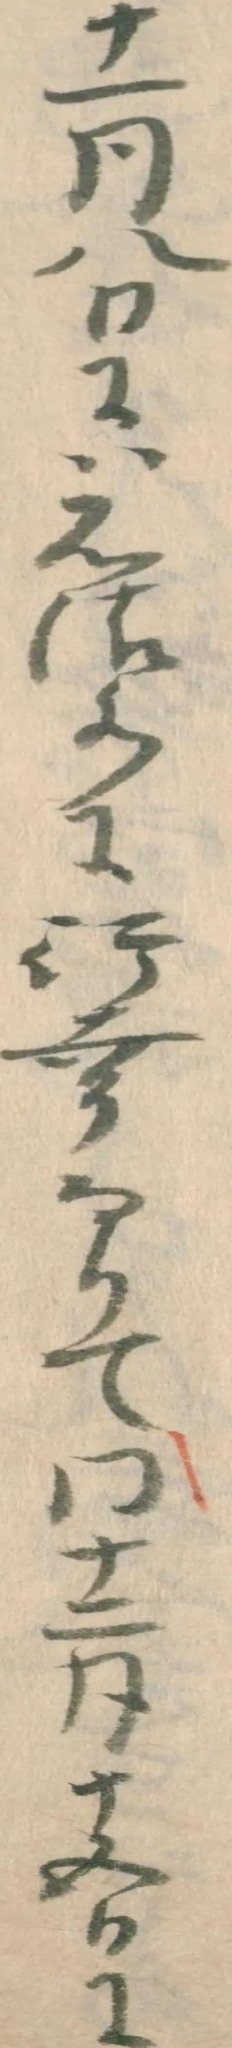十一月八日には石清水に行幸なりて同十二月十五日に
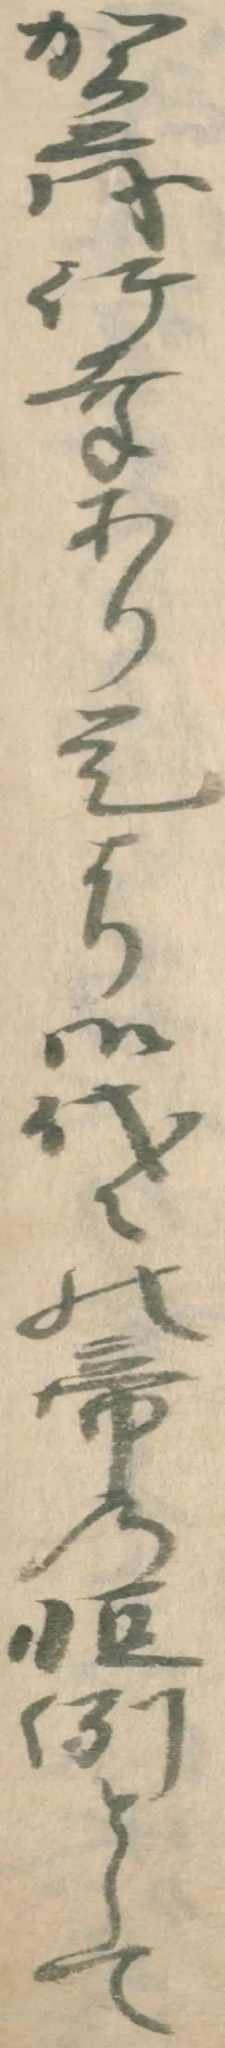賀茂行幸あり是より御代々の帝の恒例として

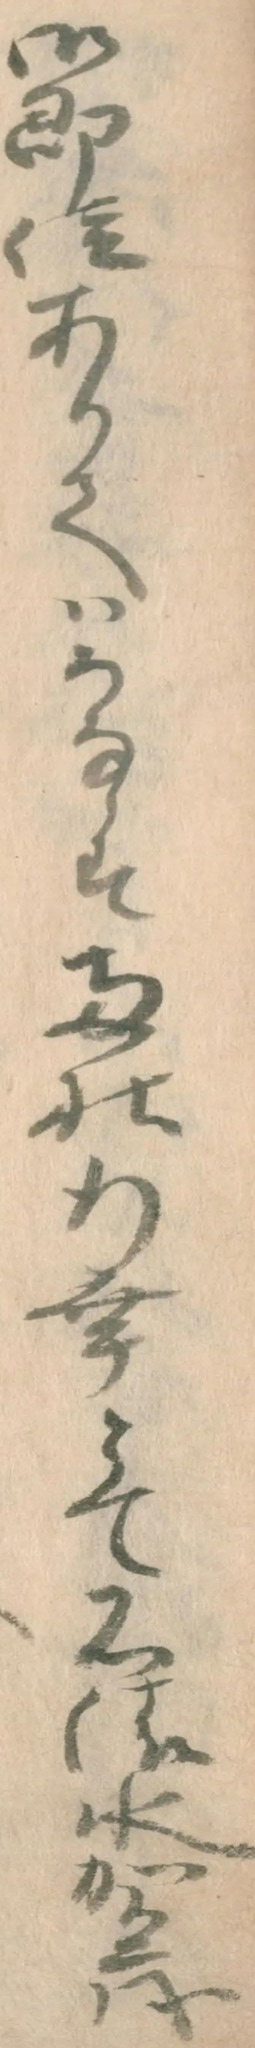御即位ありてはかならす両社行幸とて石清水賀茂
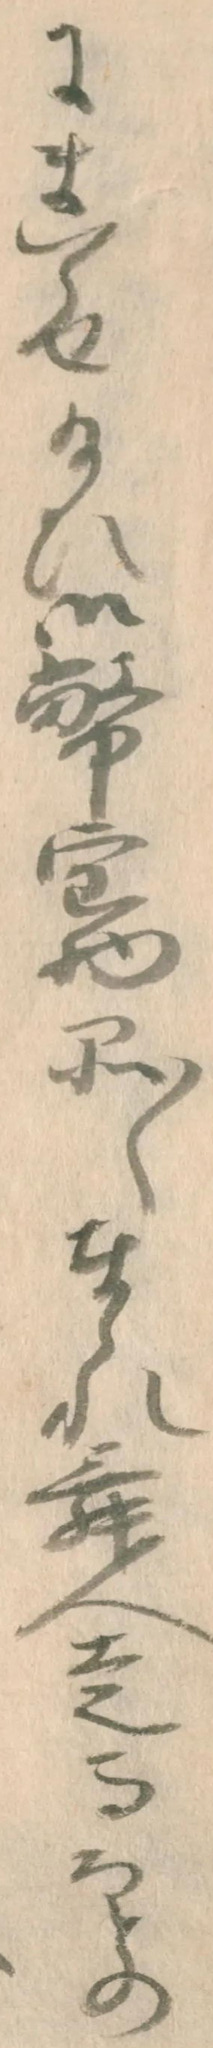にまいらせ給ひ御幣宝物品〳〵奉られ舞人走馬なとの
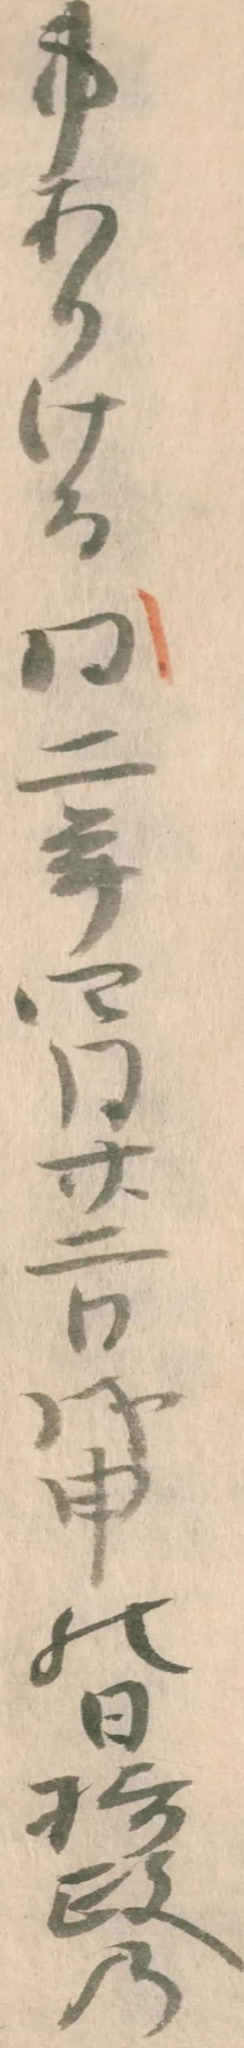事ありける同二年四月廿二日戊申の日摂政の
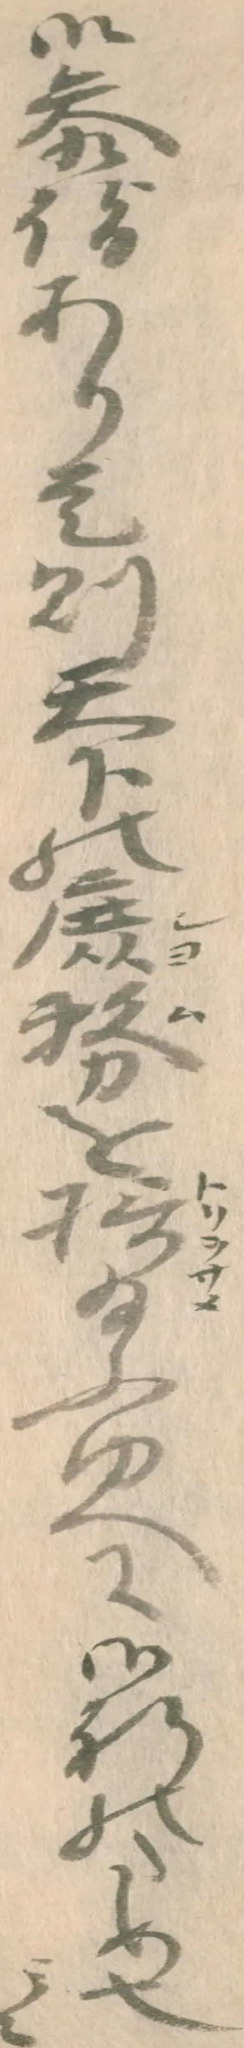御参詣あり是則天下の庶務を摂給ふゆへに御祈のため也云々
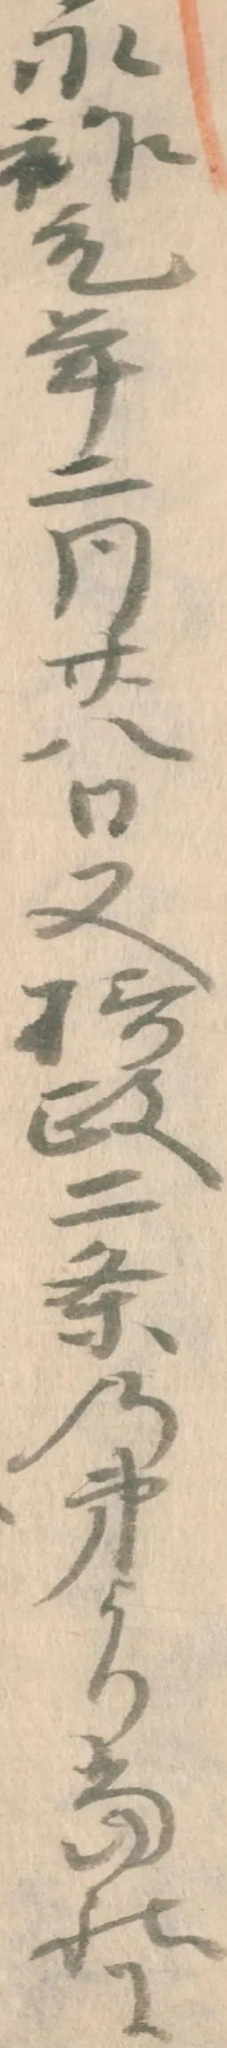永祚元年二月廿八日又摂政二条の第より当社に
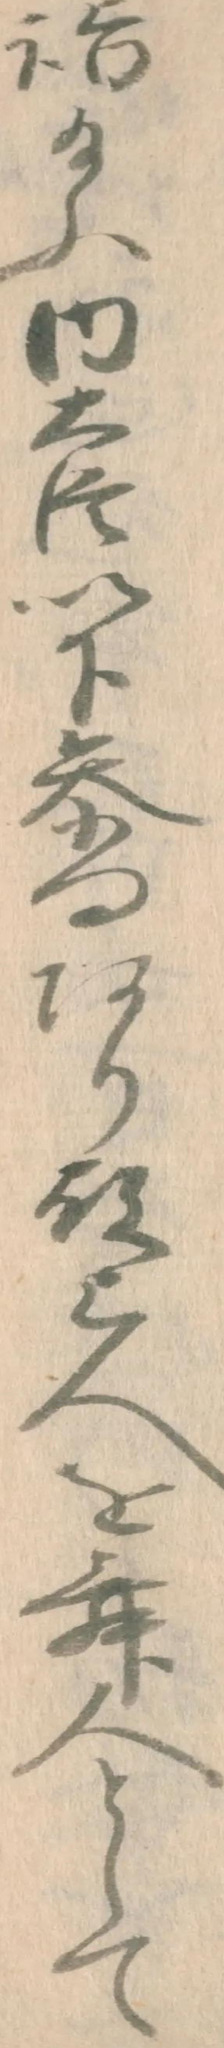詣給ふ内大臣以下参向あり殿上人を舞人として
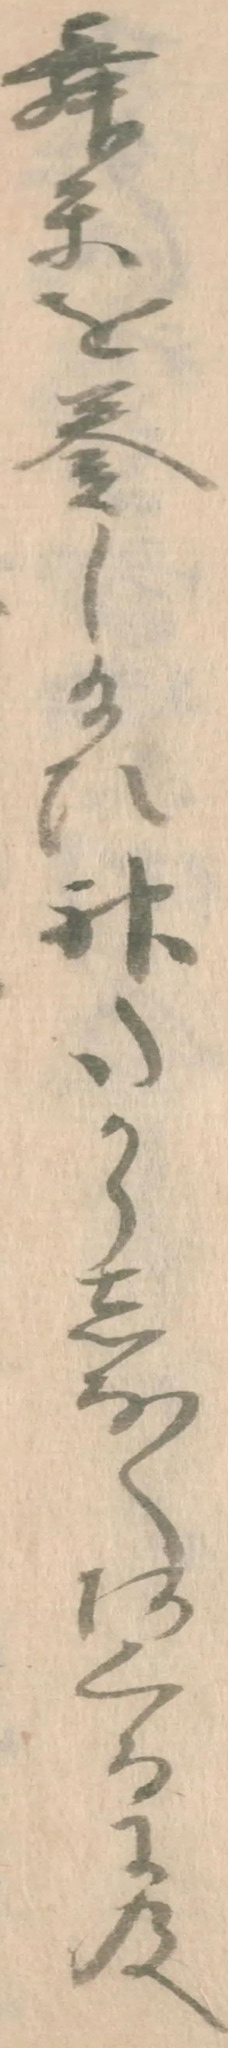舞楽を奏し給ひ神たからしな〳〵あくるに及
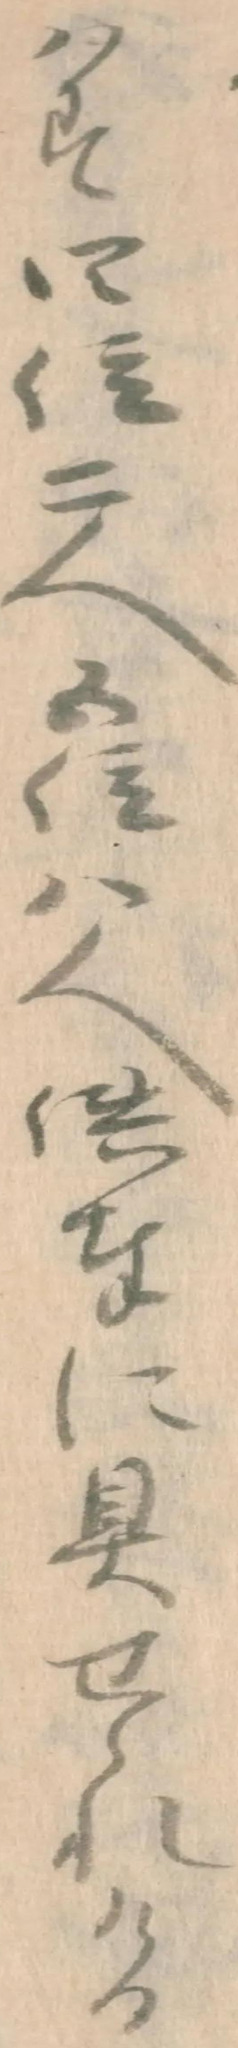はす四位二人五位八人供奉に具せられける
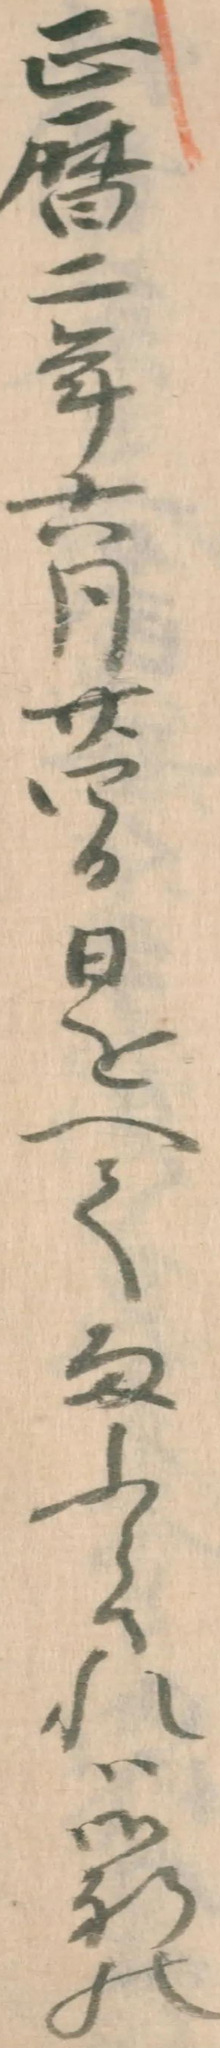正暦二年六月廿四日日をへて雨ふらされは御祈の
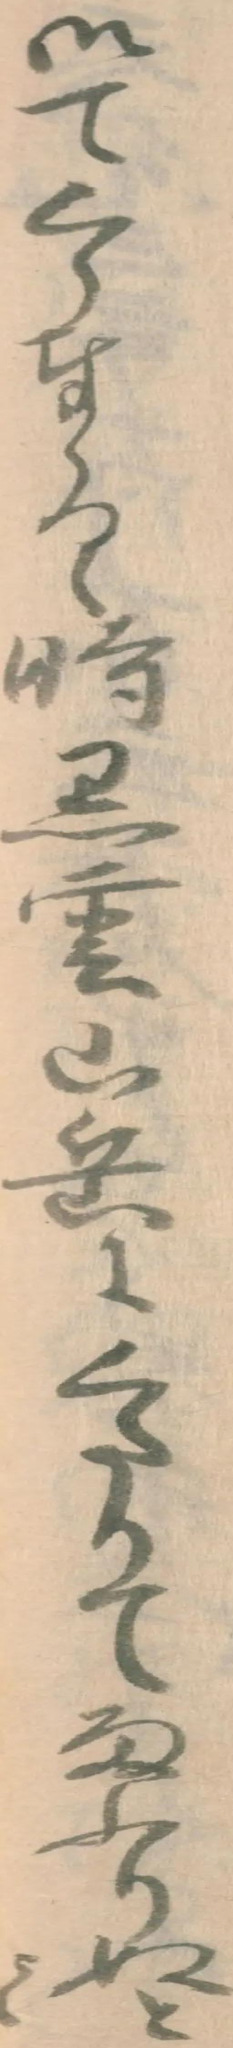御てくら奉らるゝ時黒雲山岳にくたりて雨ふりぬと云々
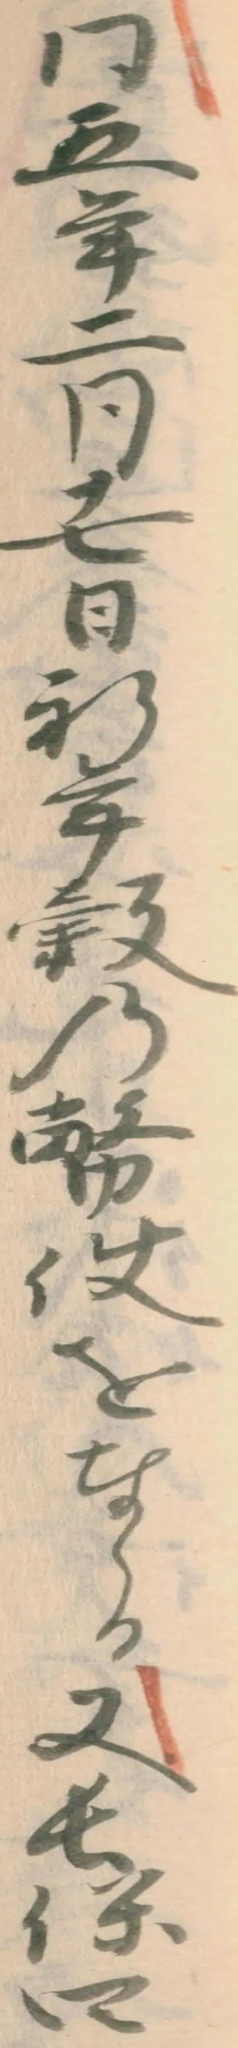同五年二月十七日祈年穀の幣使を奉らる又長保四
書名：賀茂社記録. 第1冊
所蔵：国立国会図書館 National Diet Library, JAPAN
